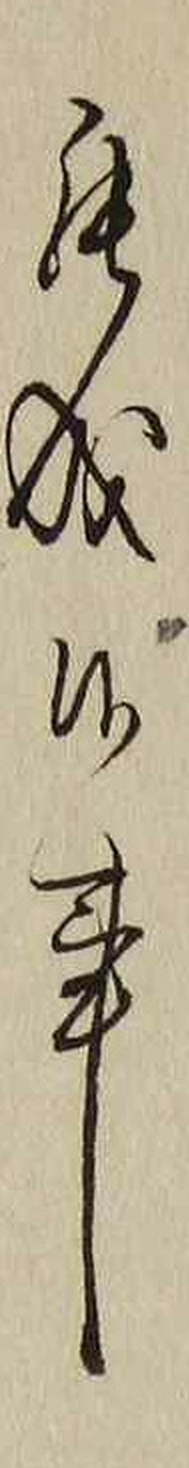罷成候事
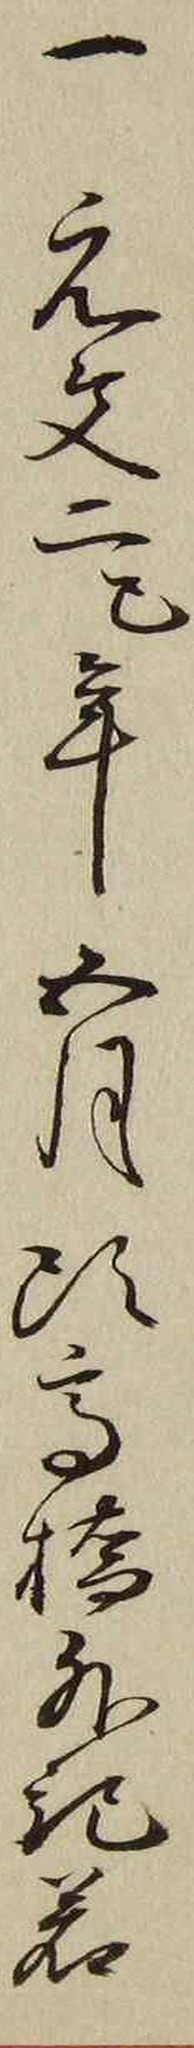一元文二巳年五月頭高橋外記若
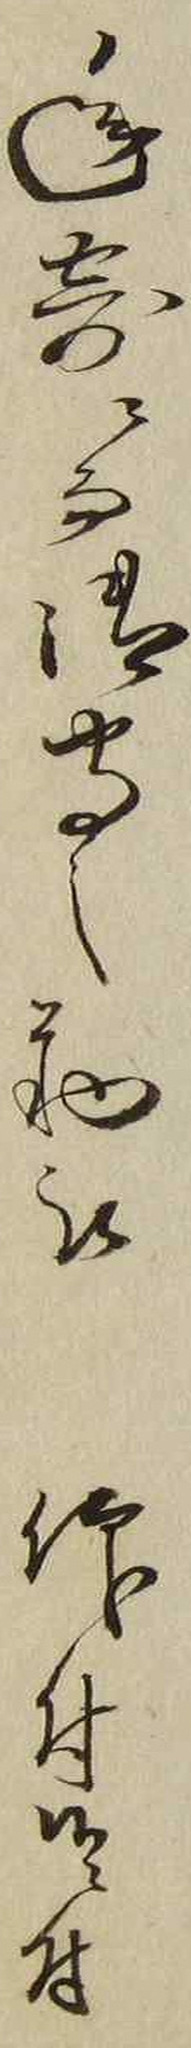年寄に而御守の勤被仰付候に付

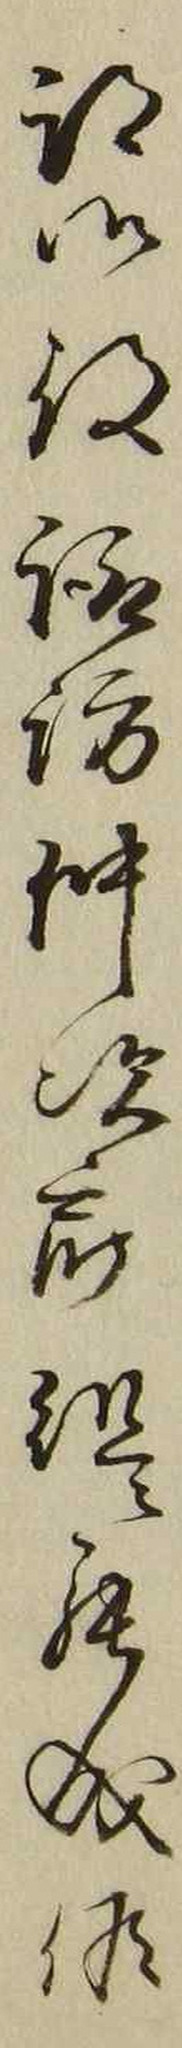跡御役諏訪仲次郎組に罷成候
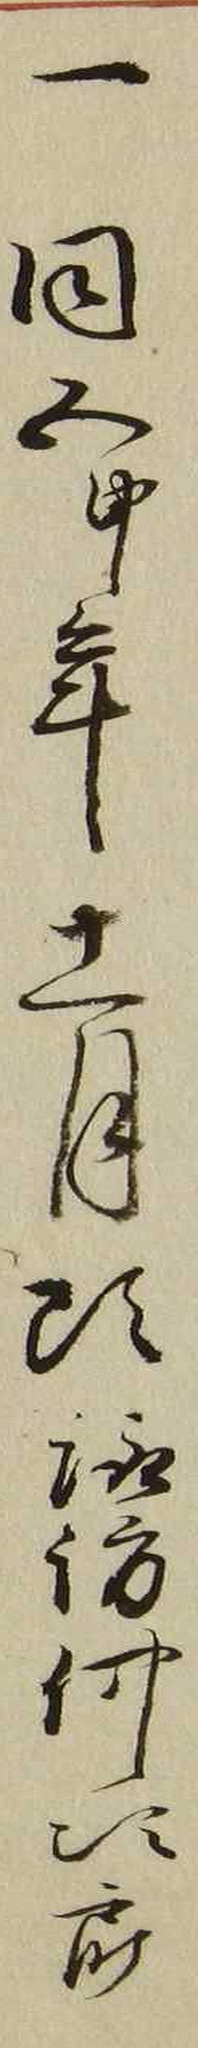一同五申年十一月頭諏訪仲次郎
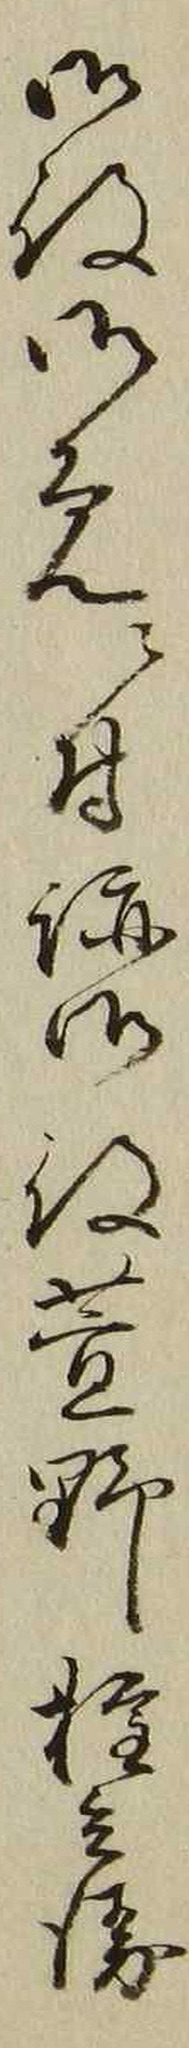御役御免に付跡御役萱野権兵衛
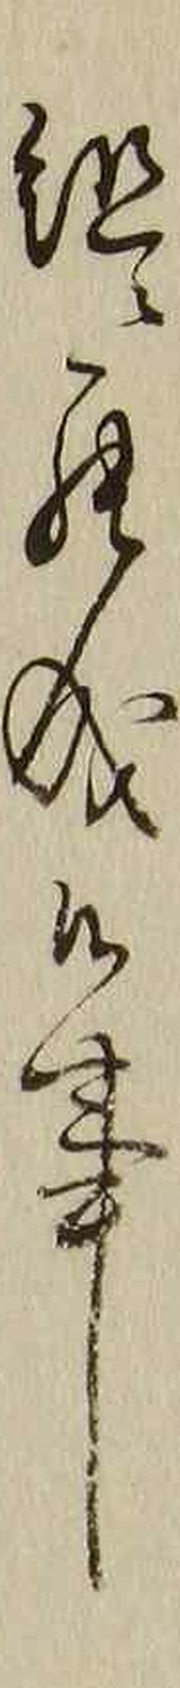組に罷成候事
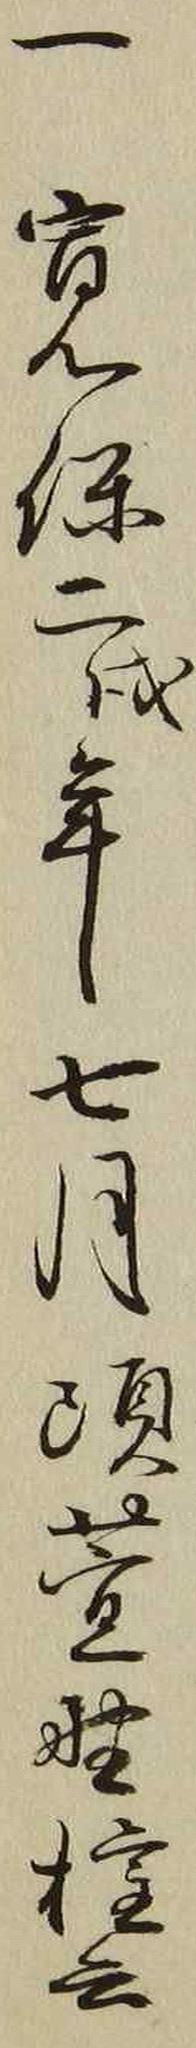一寛保二戌年七月頭萱野権兵
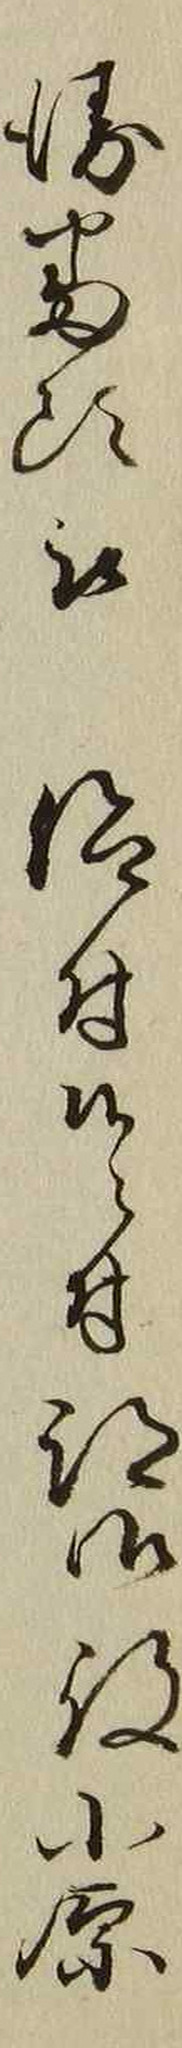衛番頭被仰付候に付跡御役小原
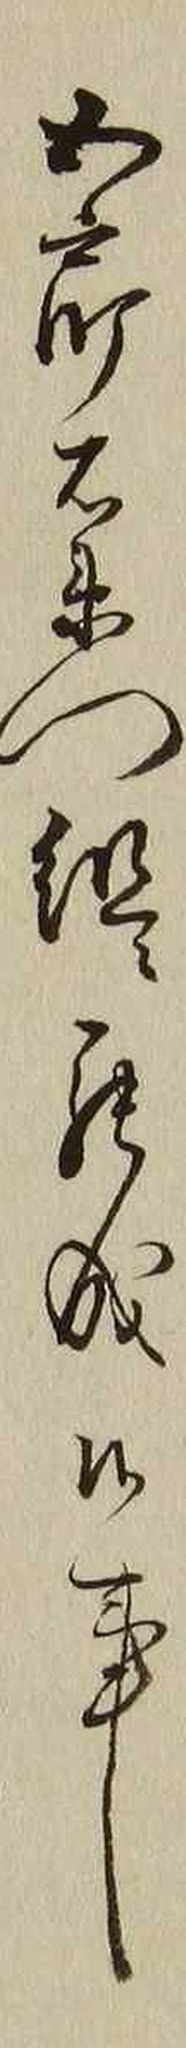五郎右衛門組に罷成候事
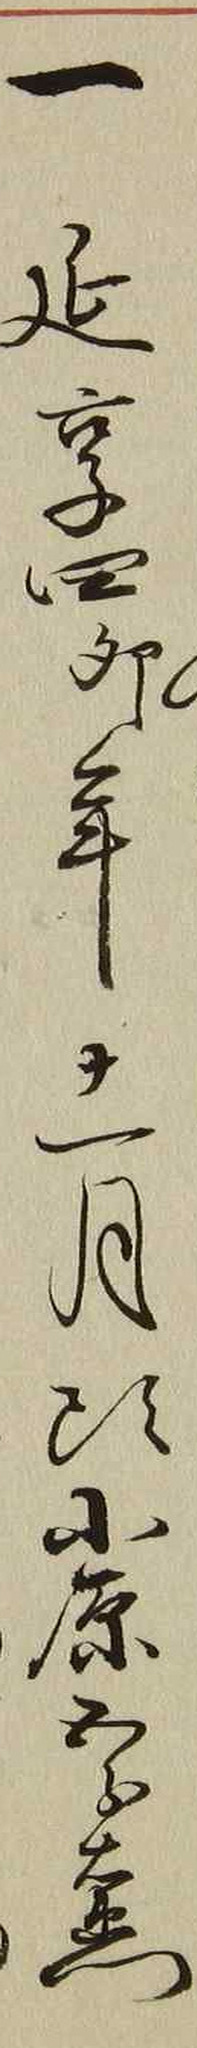一延享四卯年十一月頭小原五郎右衛門
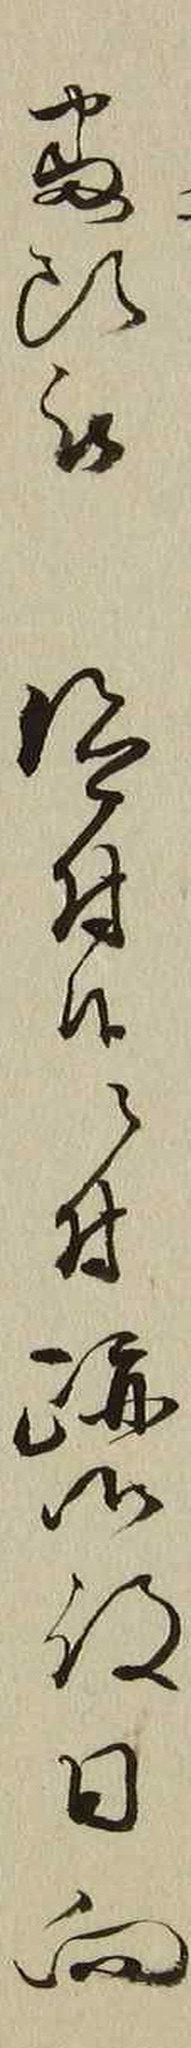番頭被仰付候に付跡御役日向
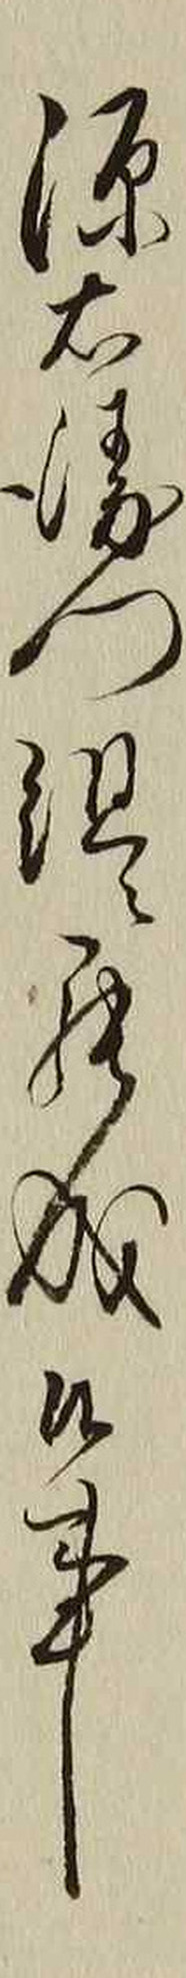源右衛門組に罷成候事
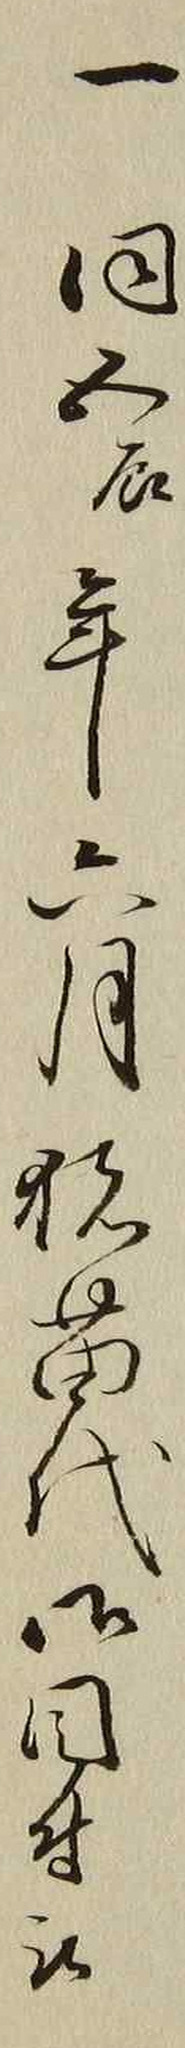一同五辰年六月猪苗代御目付被
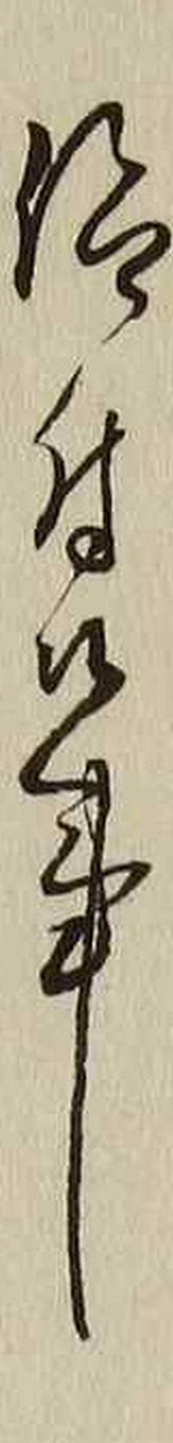仰付候事
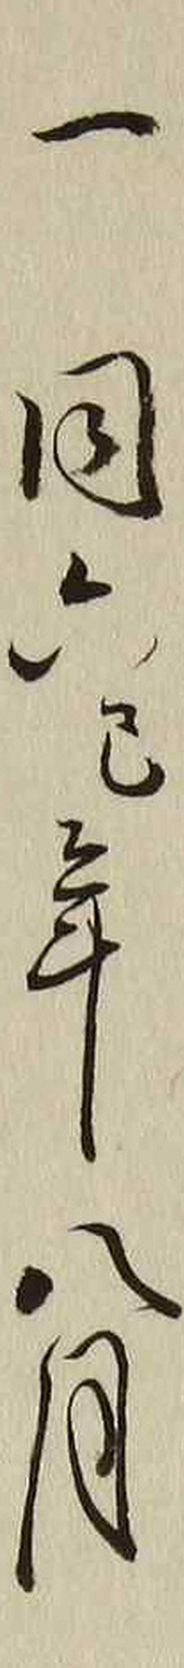一同六巳年八月
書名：諸士系譜　巻之1　い之部1
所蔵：会津若松市立会津図書館
